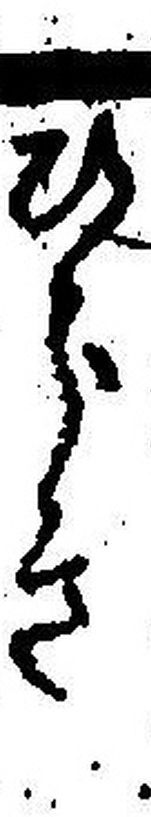ひらき
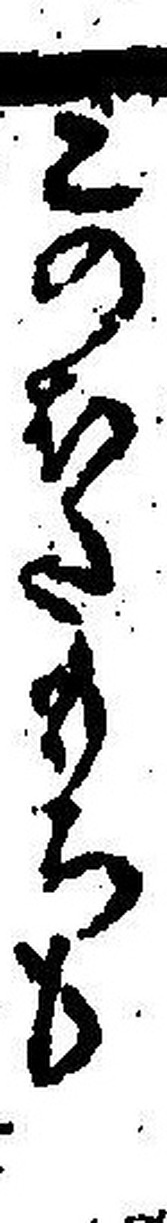このほたもちも
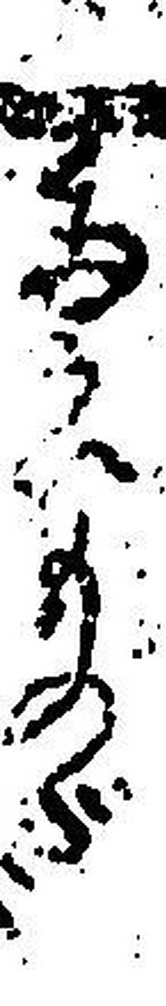たかいものだ
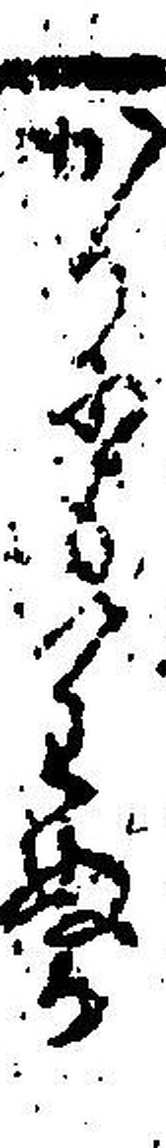かりにもいわぬが
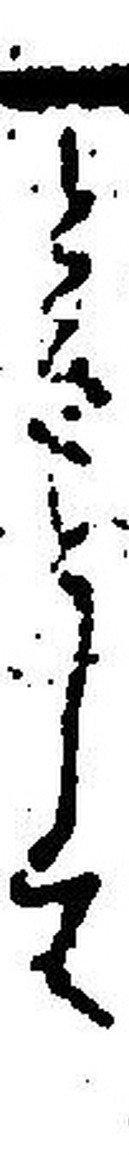ときとして
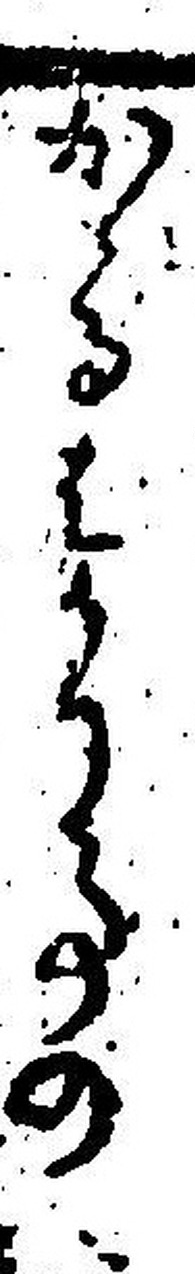かゝるはかり事の
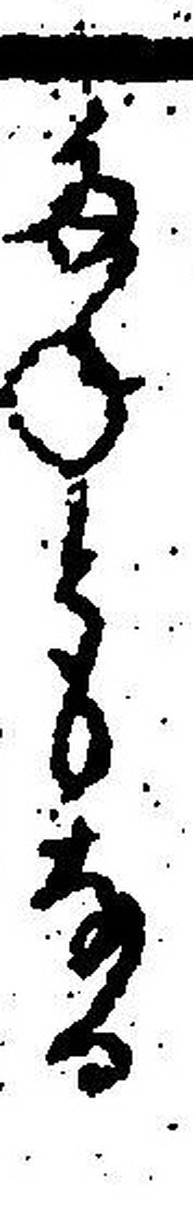たねともなる

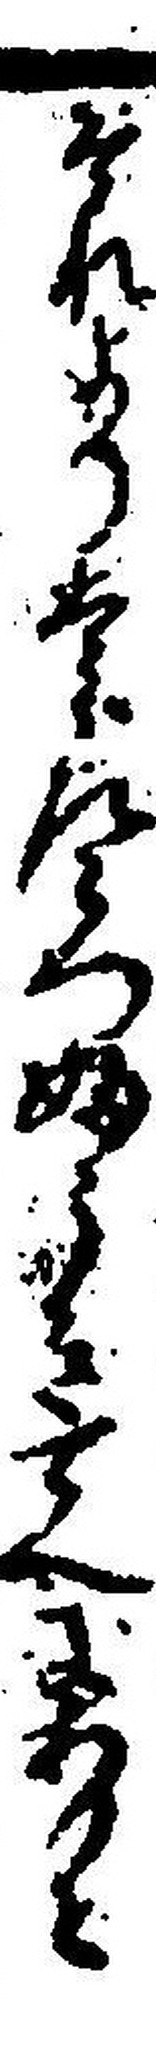それより太郎左衛門ふうきてんにありと
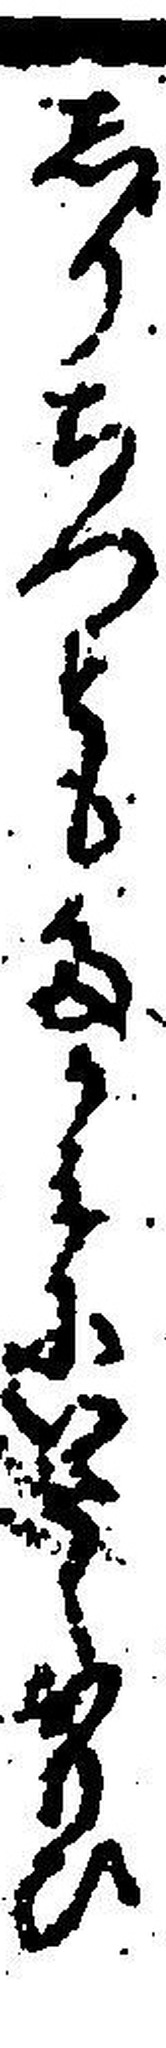しりちつともたかみにいたくおもひ
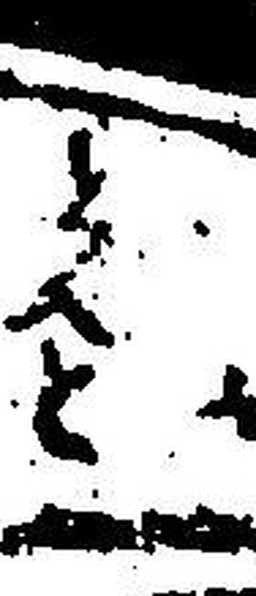とんと
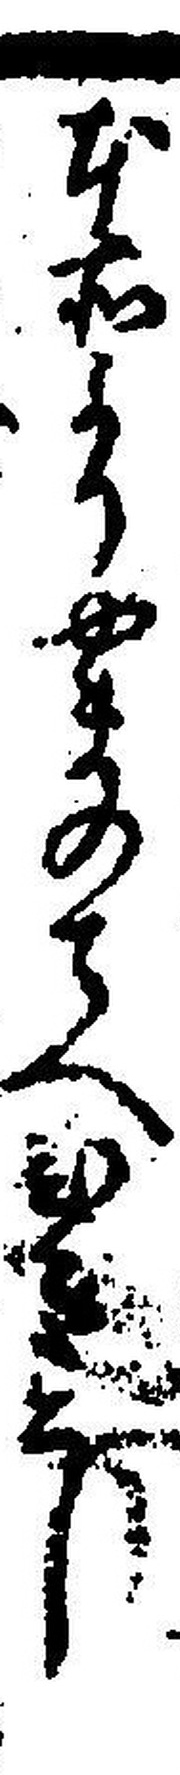本所よりやまのてへひきこし
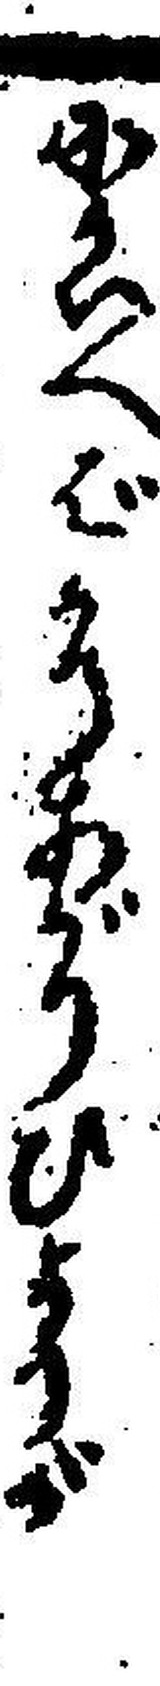にかいへばかりあがりひよりが
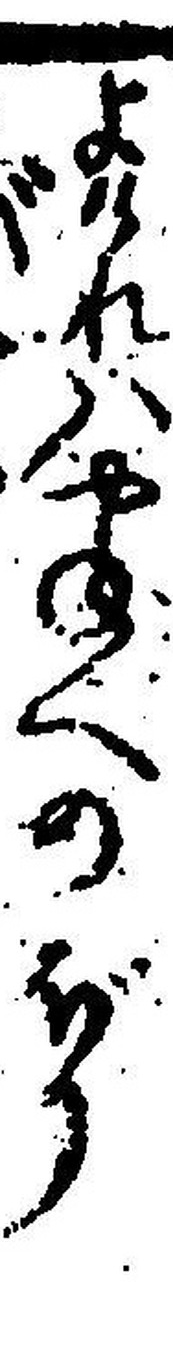よけれはやねへのぼり
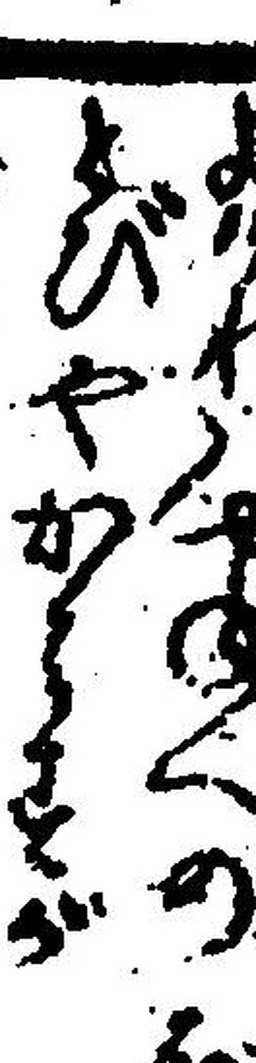とびやからすが
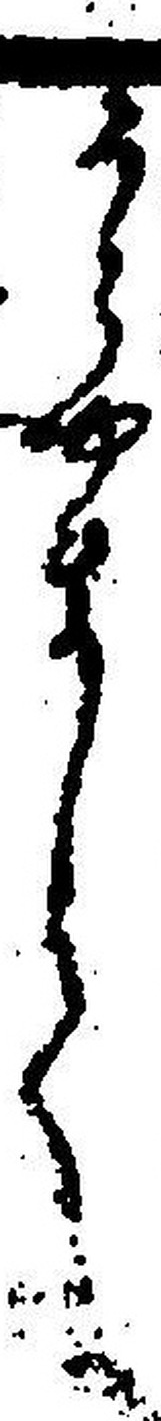うらやましく
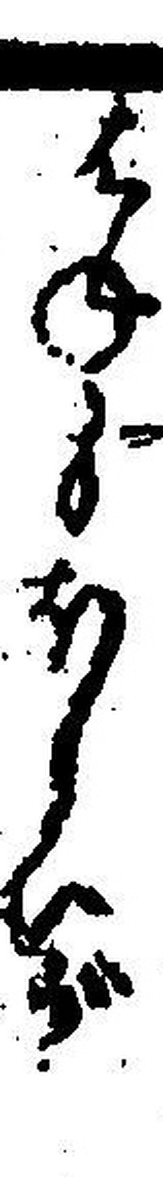はねもほしいが
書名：牡丹餅棚有 / 市場通笑作
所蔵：東京大学総合図書館 General Library in the University of Tokyo, JAPAN
